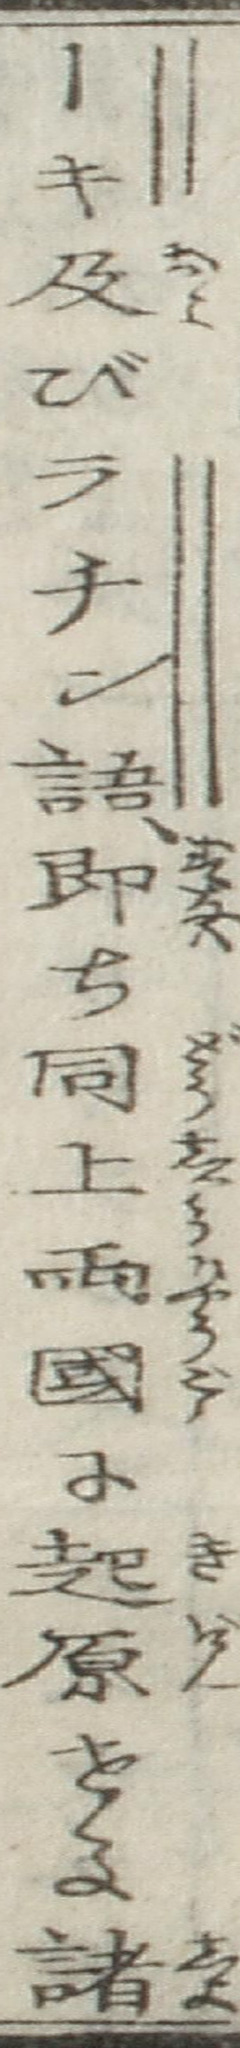ーキ及びラチン語、即ち同上両国に起原せる諸
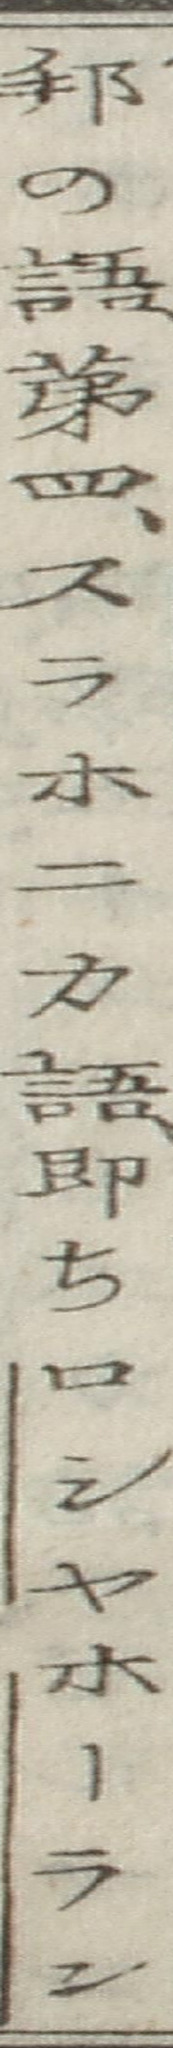邦の語、第四、スラホニカ語、即ちロシヤホーラン

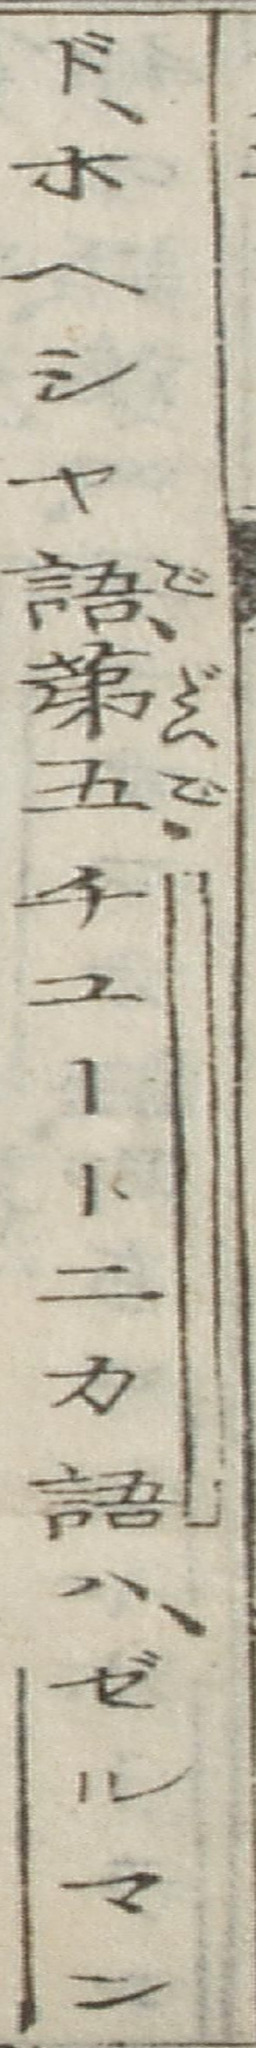ド、ホヘシヤ語、第五、チユートニカ語は、ゼルマン
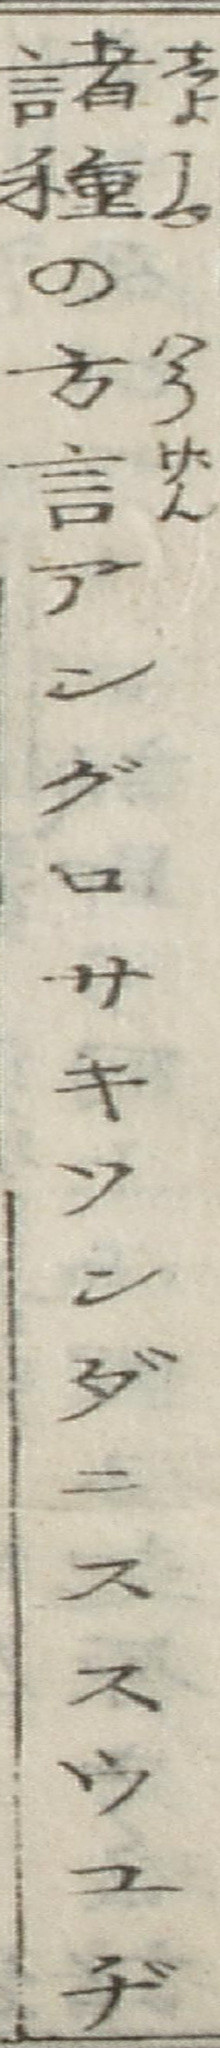諸種の方言アングロサキソンダニススウユヂ
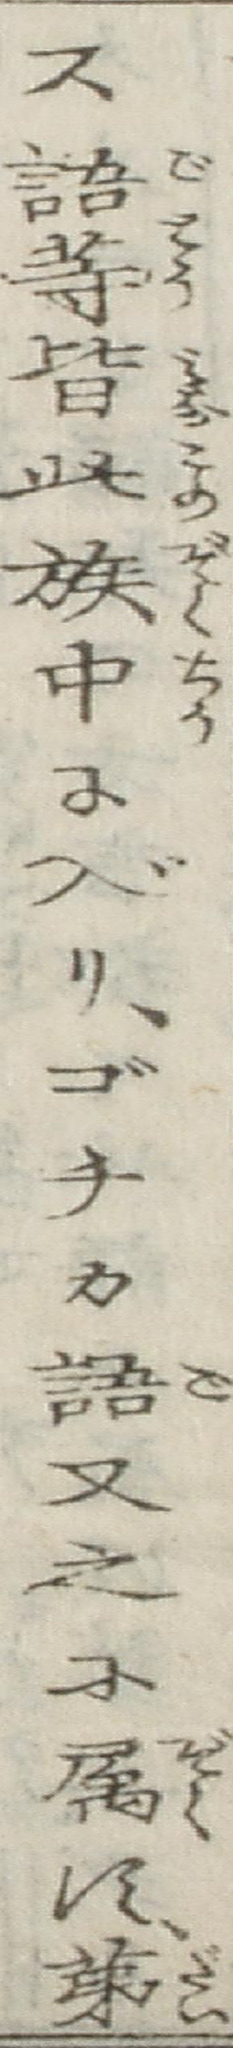ス語等皆此族中に入り、ゴチカ語又之に属す、第
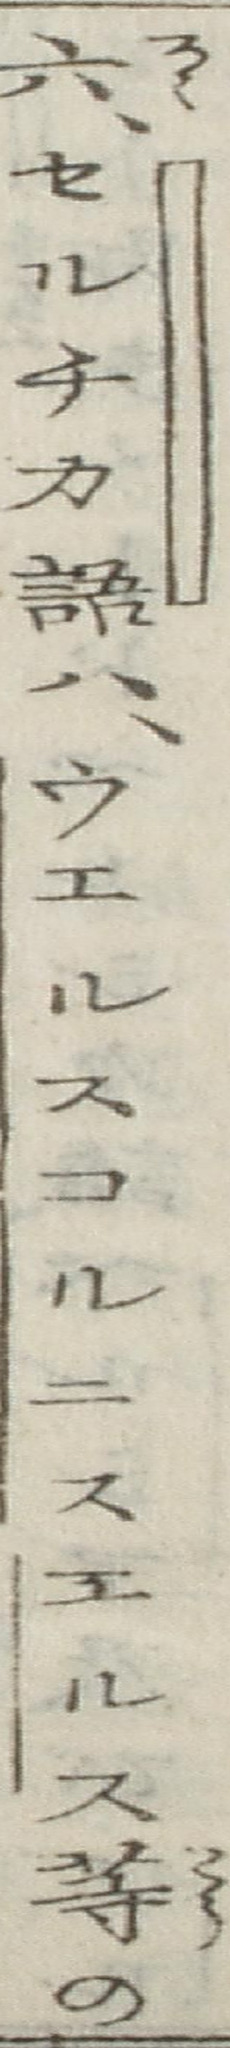六、セルチカ語は、ウエルスコルニスエルス等の
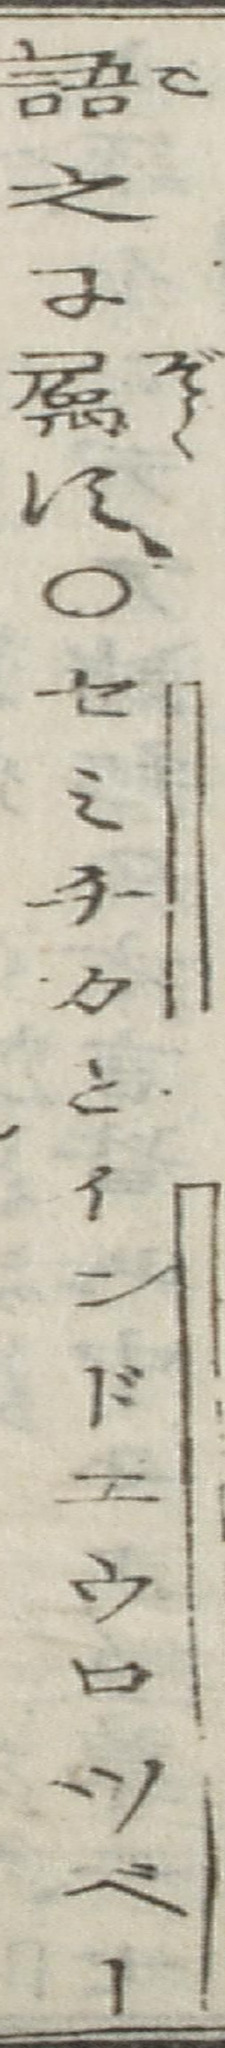語之に属す、○セミチカとインドエウロツベー
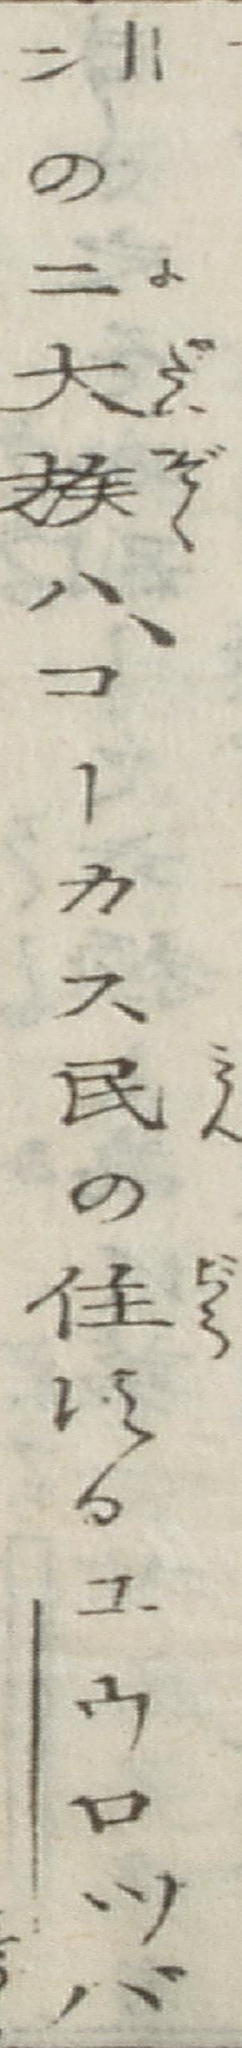ンの二大族は、コーカス民の住するユウロツバ
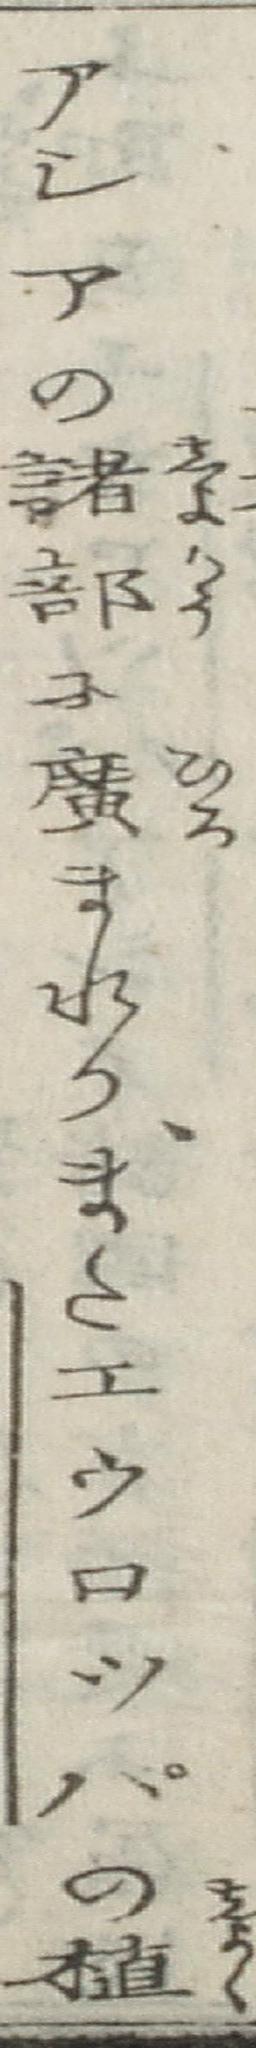アシアの諸部に広まれり、またエウロツパの植←
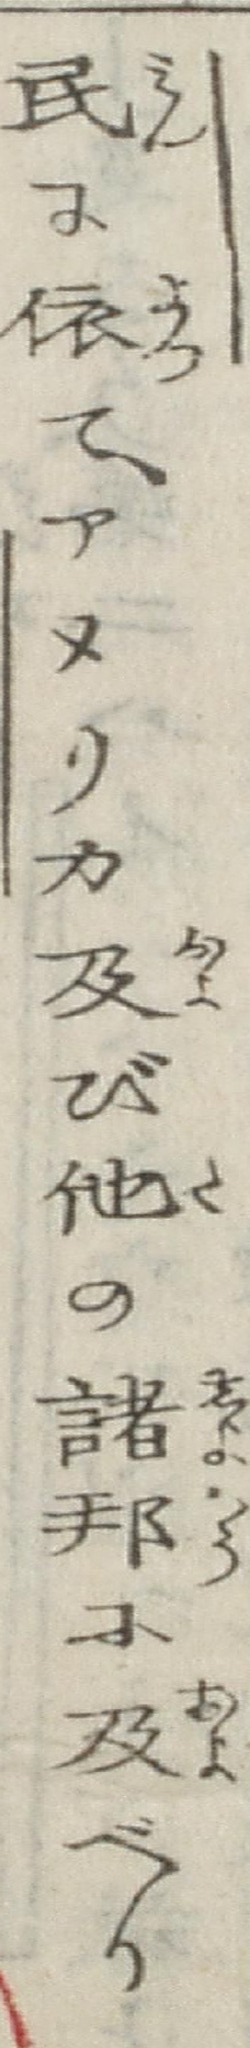民に依てアメリカ及び他の諸邦に及べり
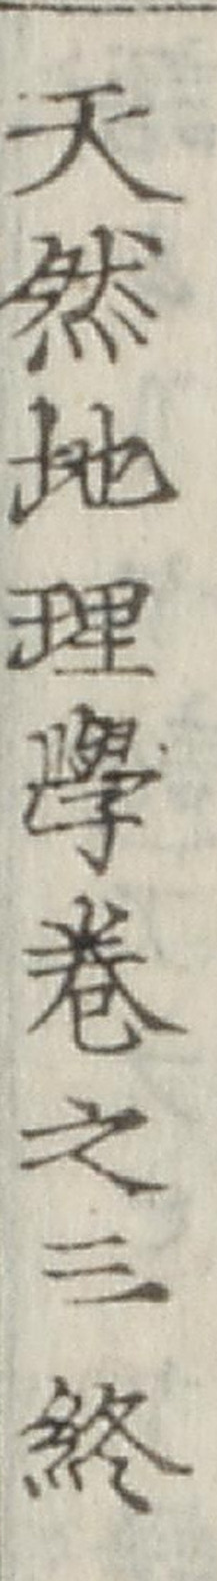天然地理学巻之三終
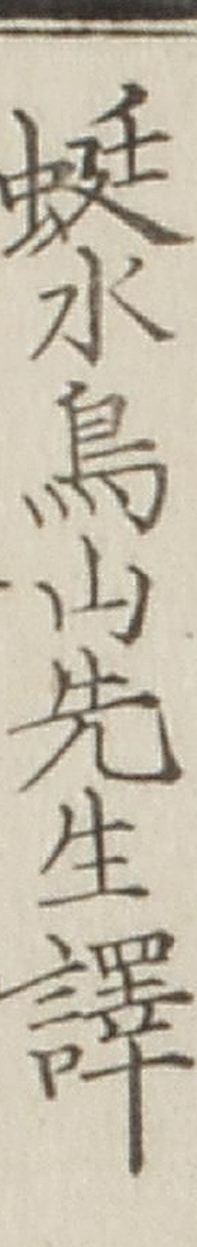蜓水鳥山先生譯
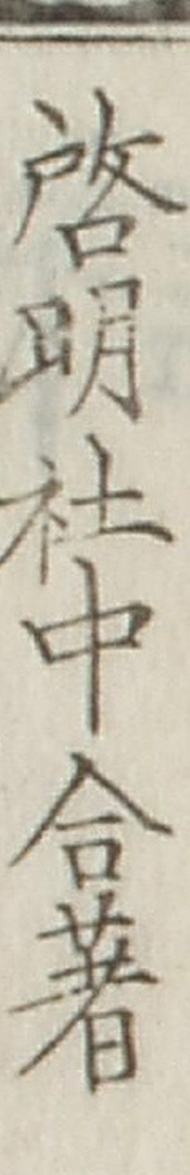啓明社中合著

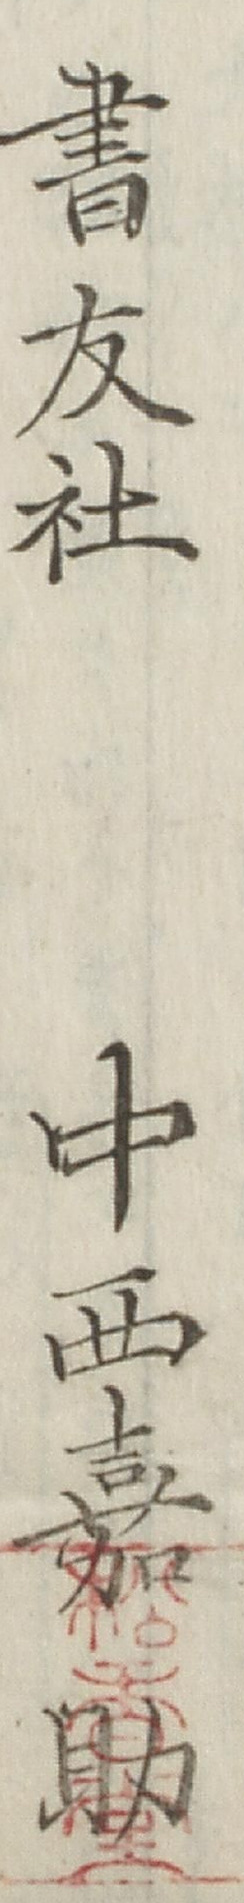書友社中西嘉助
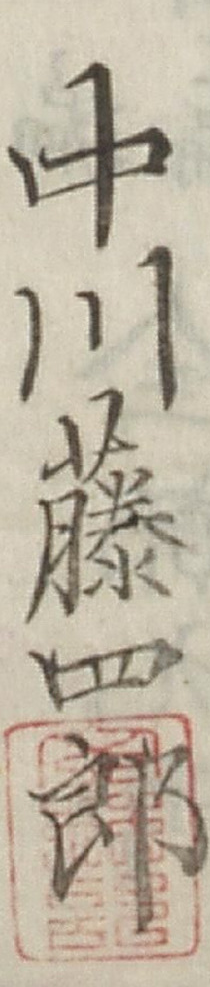中川藤四郎
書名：訓蒙　天然地理學　下
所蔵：東京大学地震研究所図書室 Earthquake Research Institute Library, The University of Tokyo, JAPAN
